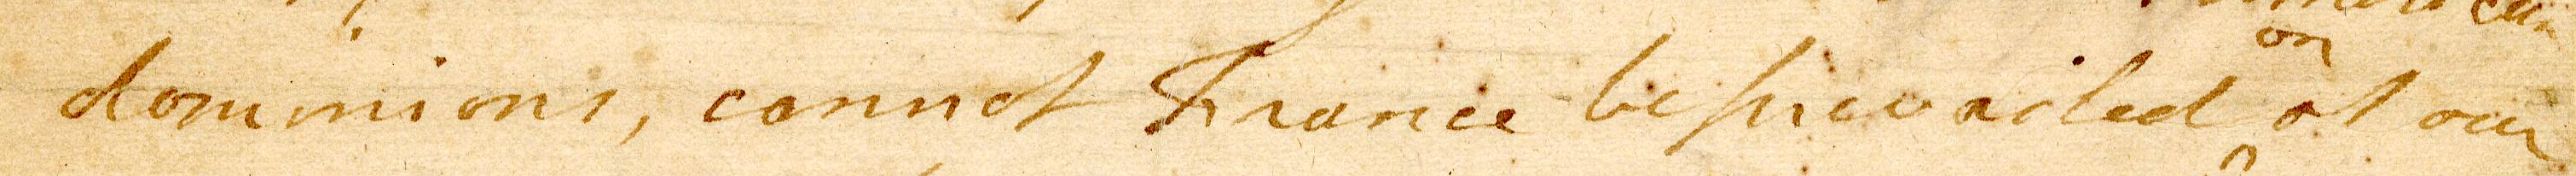Dominions, cannot France be proved of our
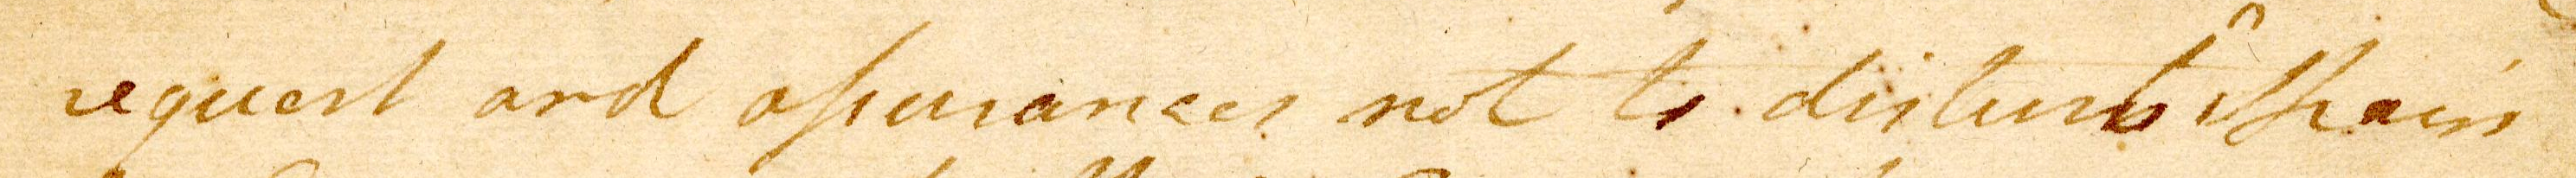request and assurances not to distrust shairs
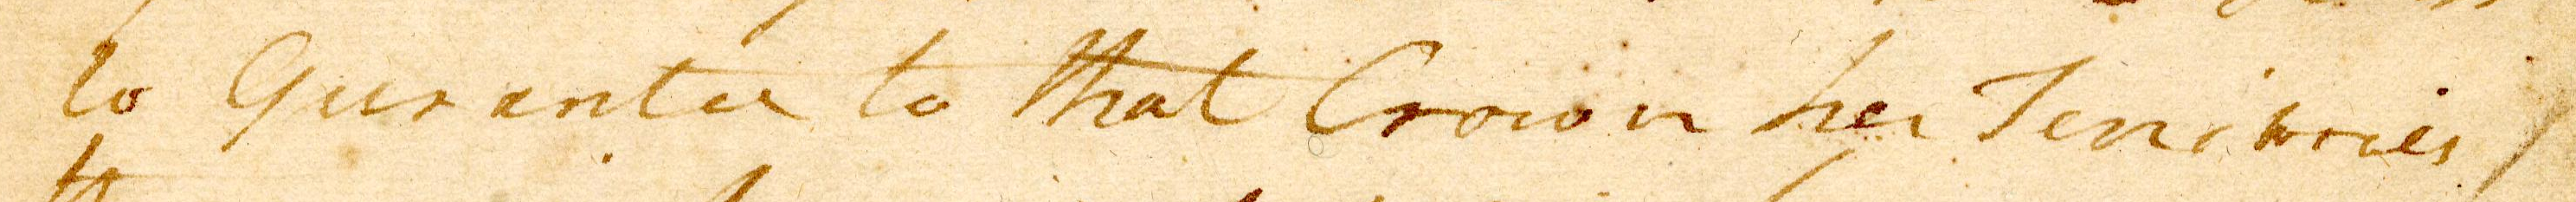to Guarantee to that Crown her territories
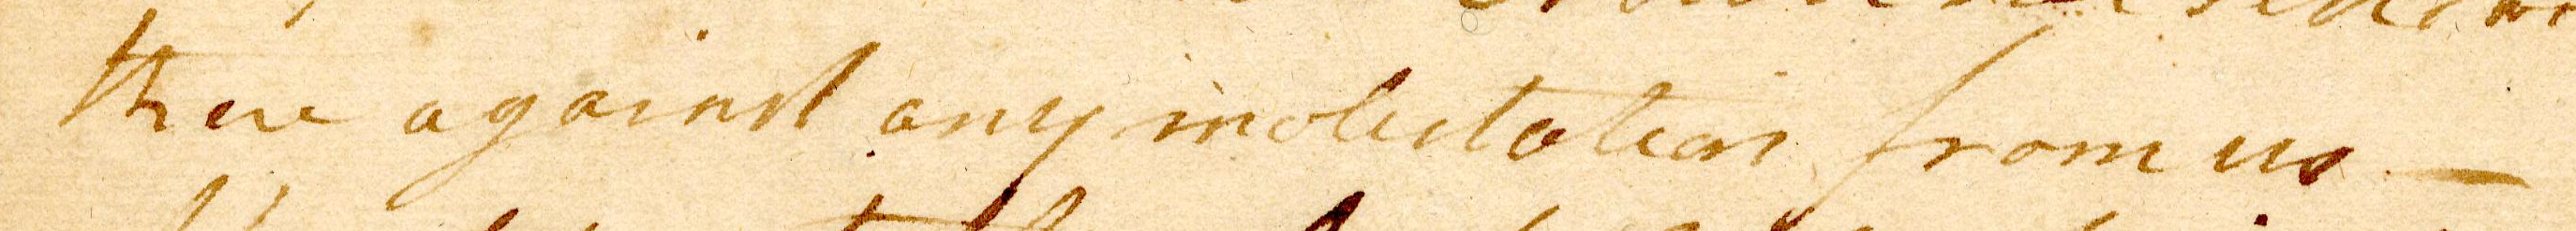there against any molestation from us-
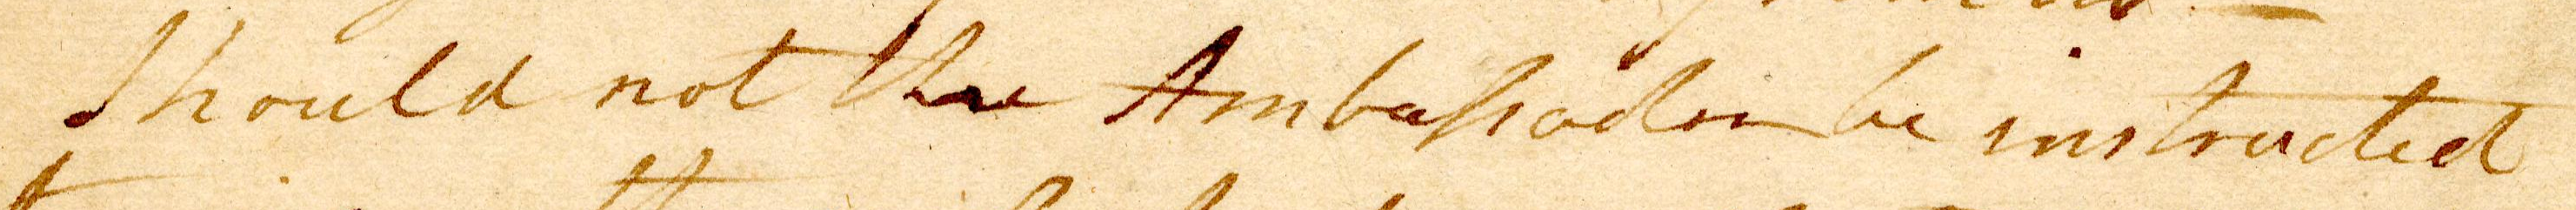Should not the Ambassador be instructed
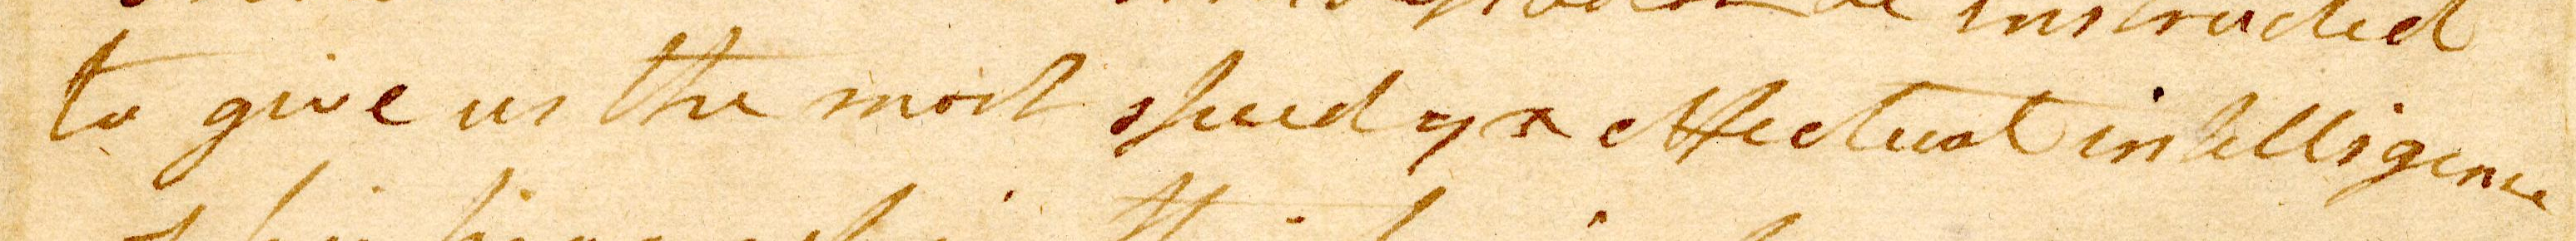to give us the most speedy & effectual intelligence
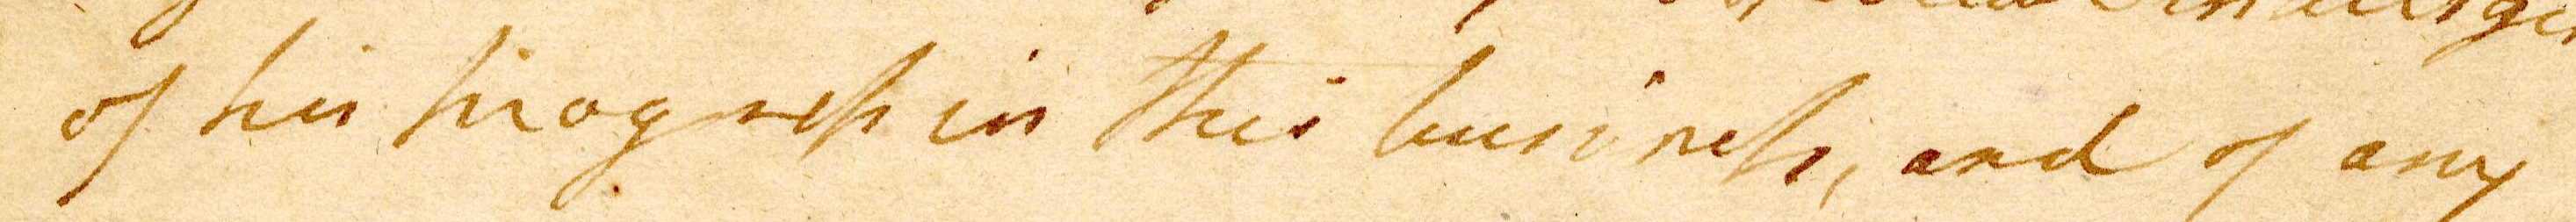of his progress in this business, and of any
